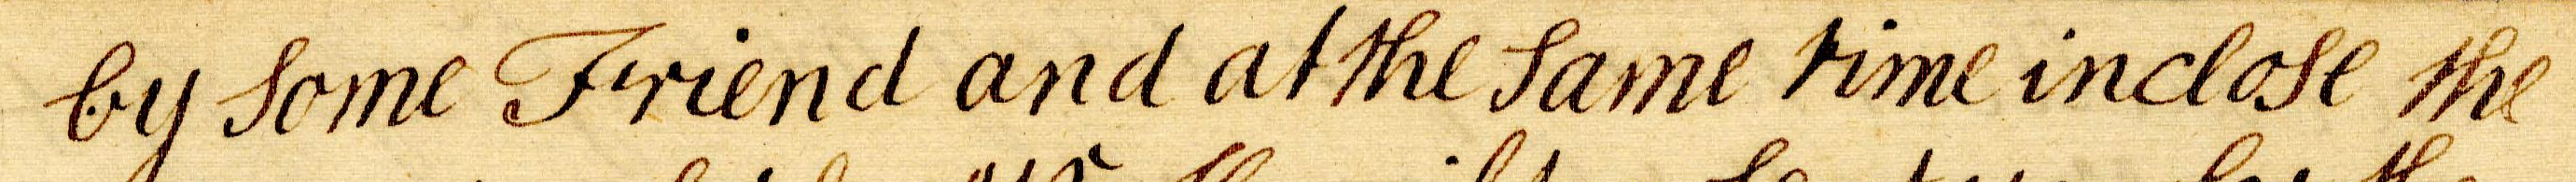by some Friend and at the same time inclose the
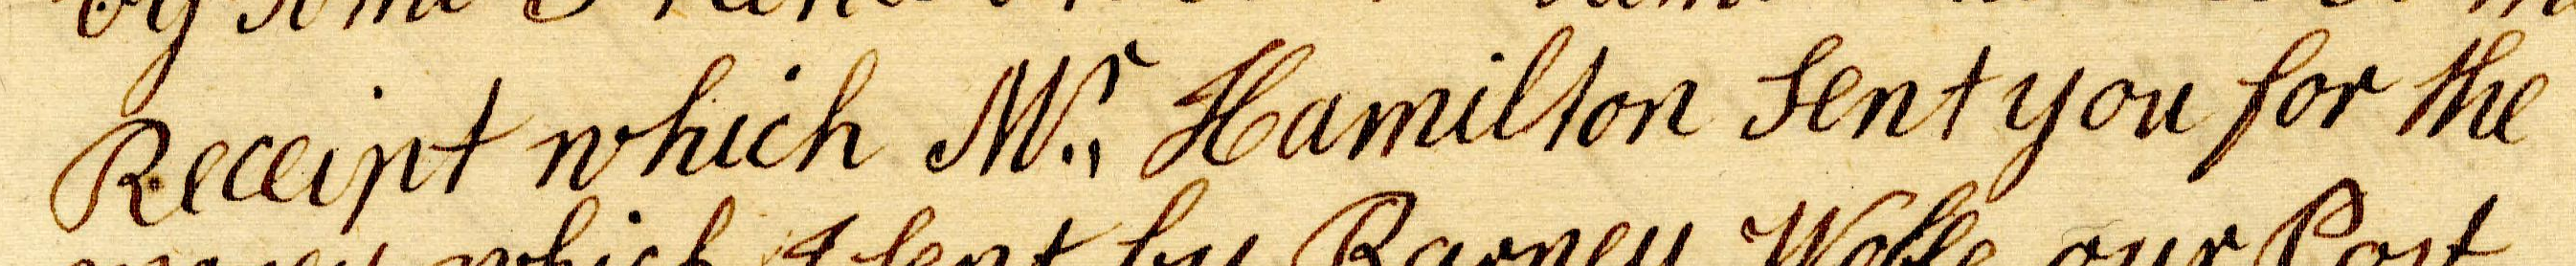Receipt which M^r. Hamilton Sent you for the
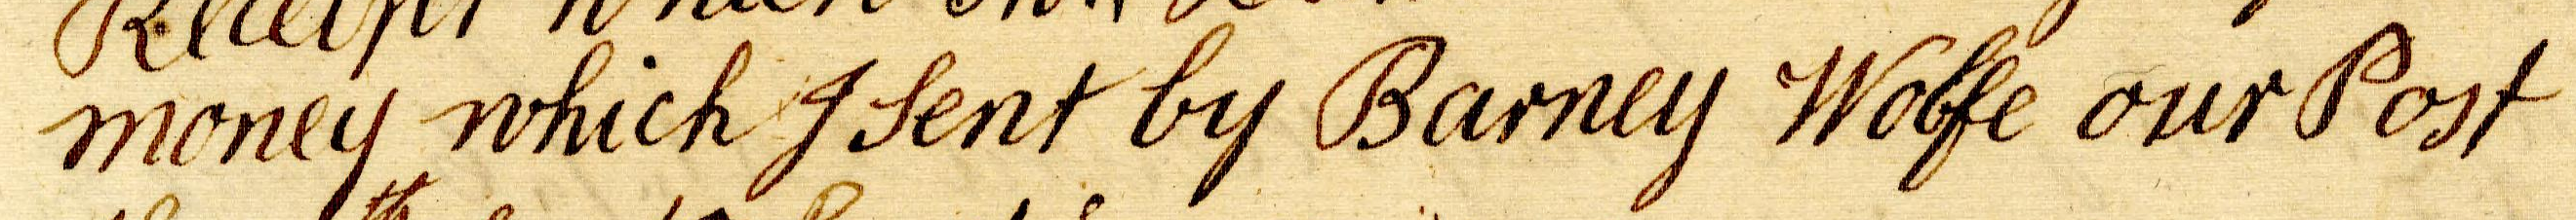money which I Sent by Barney Wolfe our Post
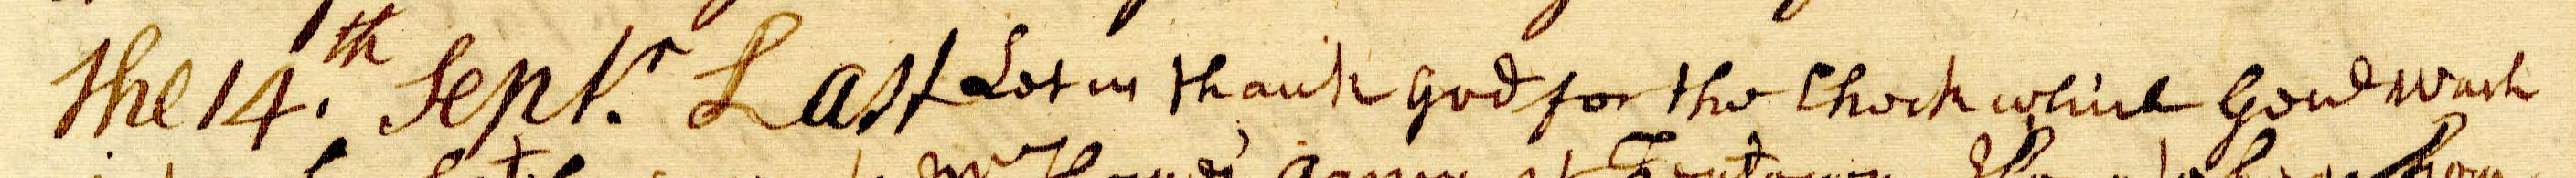the 14^th. Sept^r. Last Let us thank God for the Check which Gen^l Wash
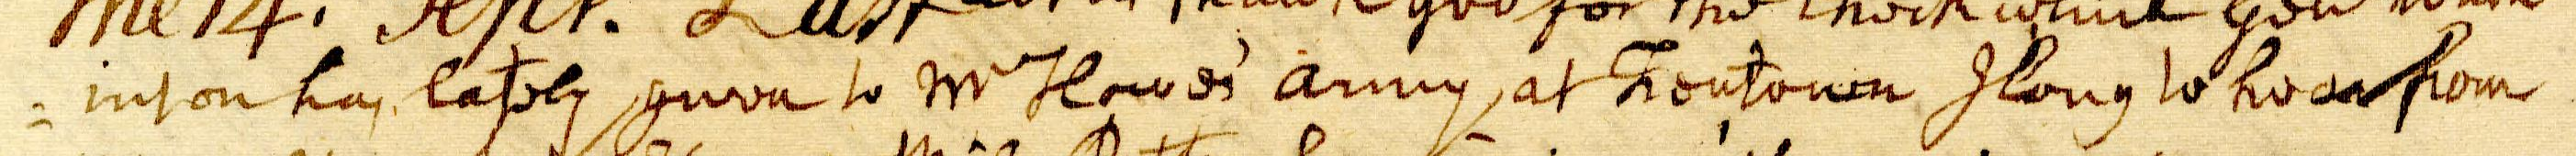-inton has lately given to M^r Howes' Army, at Floutown I long to hear from
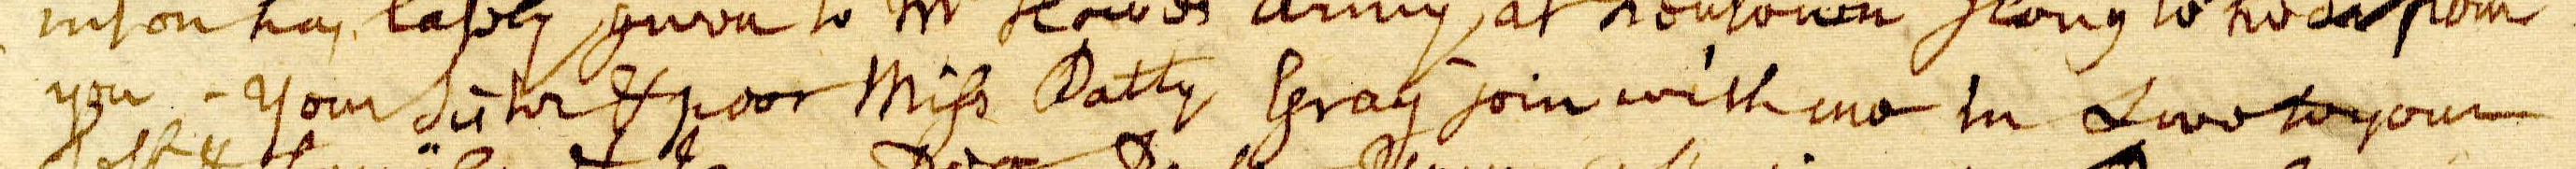you- Your Sister & poor Miss Patty Gray join with me in Love to your
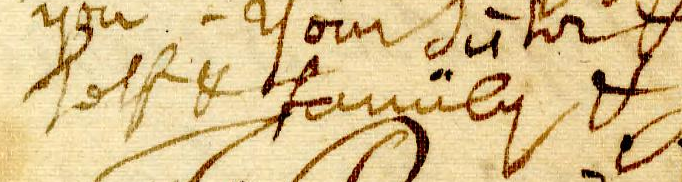self & family
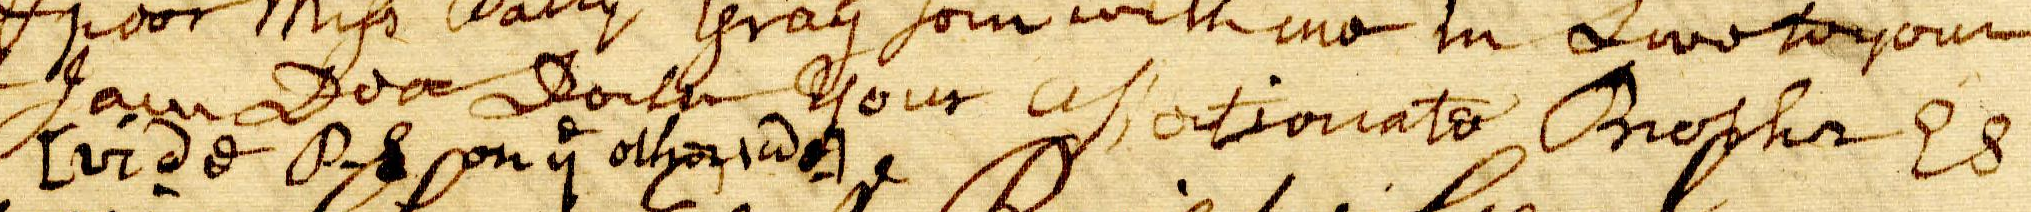I am Dear Doter Your Affectionate Brother
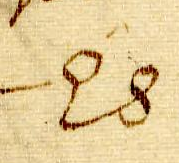ES
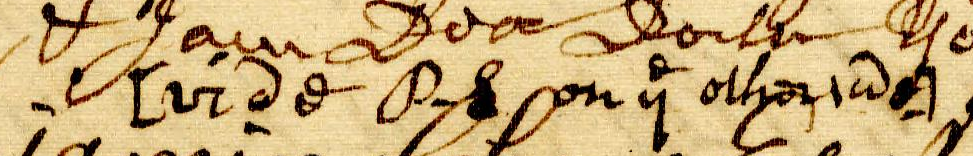(ride PS on y^e other side)
